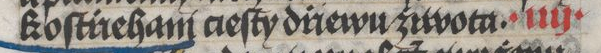koſtṙiehaní cieſty dṙiewu żiwota..iiij.
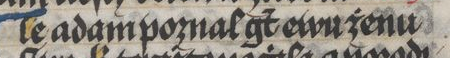le adam poznal ḡt ewu żenu
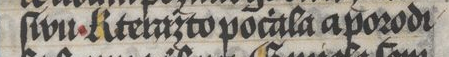ſwu.Kterażto poċala a porodi¬
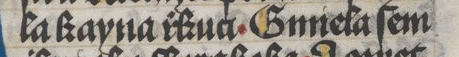la kayna ṙkuci.Smiela ſem
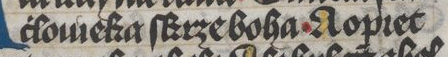ċlouieka ſkrze boha.A opiet
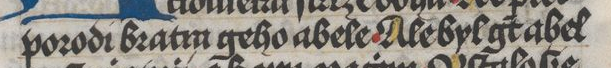porodí bratra geho abele.Ale byl ḡt abel
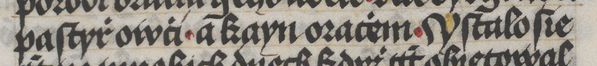paſtyṙ owċí.a kayn oraċem.Yſtalo ſíe
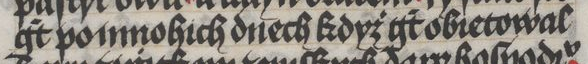ḡt po mnohich dnech kdyż ḡt obietowal
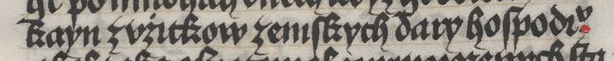kayn z vżitkow zemſkych dary hoſpodiv.
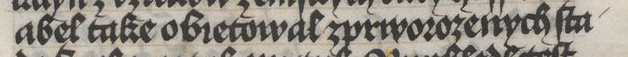abel take obietowal zprworozenych ſta¬
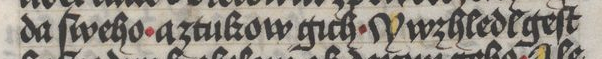da ſweho.a ztukow gich.Y wzhledl geſt
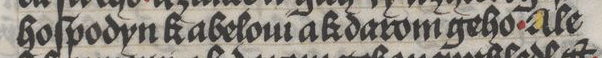hoſpodyn k abeloui a k darom geho. Ale
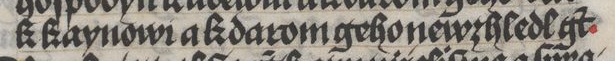k kaynowi a k darom geho newzhledl ḡt.
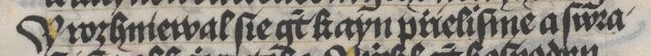Y rozhníewal ſíe ḡt kayn pṙíeliẛnie a ſwra¬
